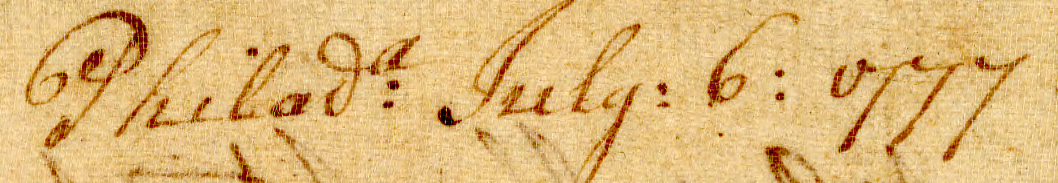Philad^a: July: 6: 1777
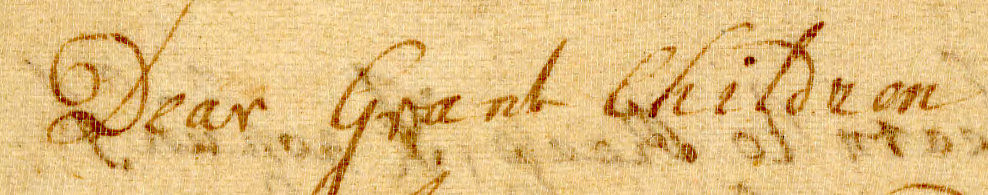Dear Grant Children
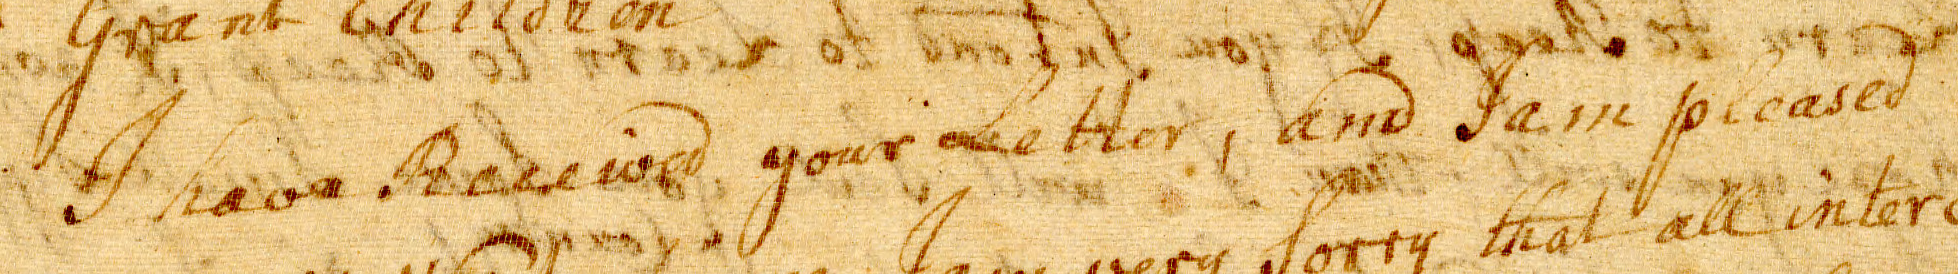I have Received your Letter, and I am pleased
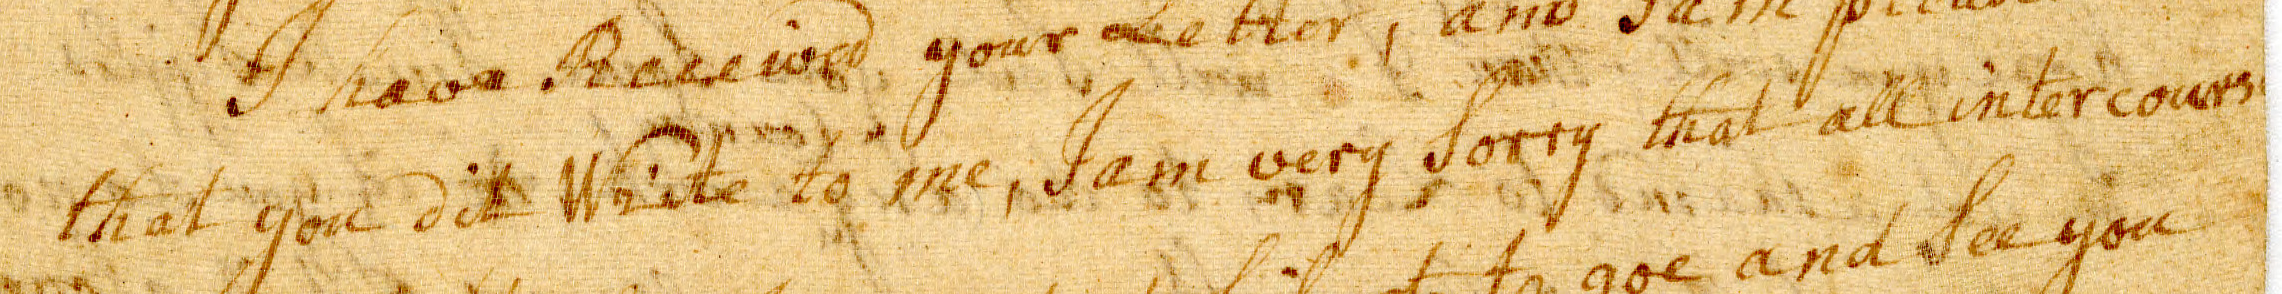that you did Write to me, I am very Sorry that all intercourse
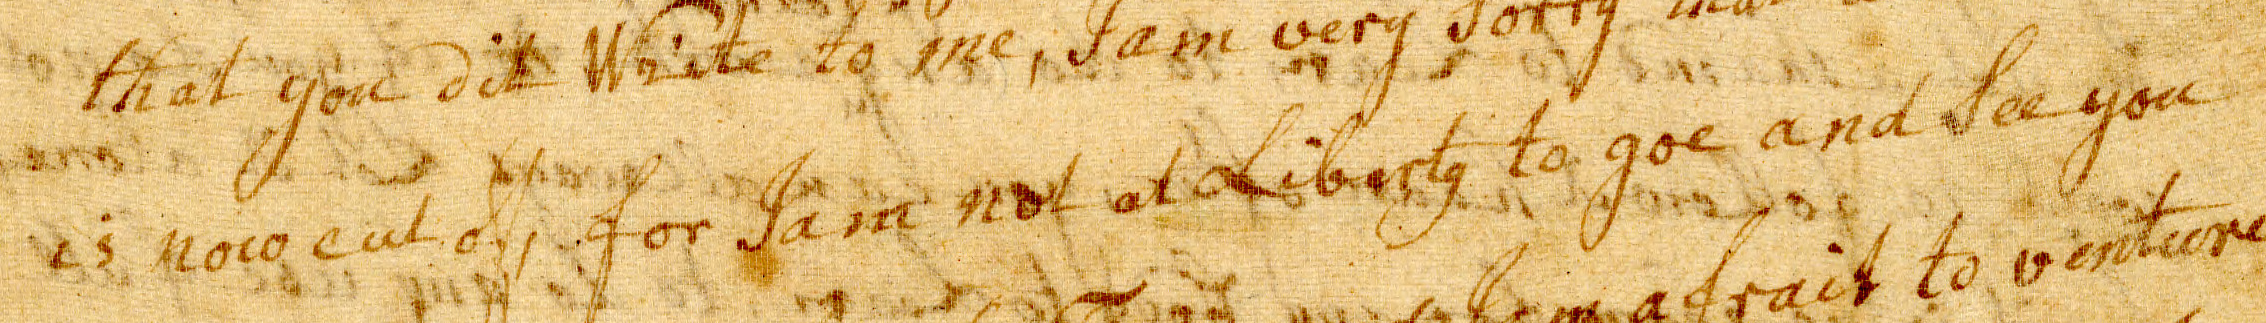is now cut of, for I am not at Liberty to goe and See you
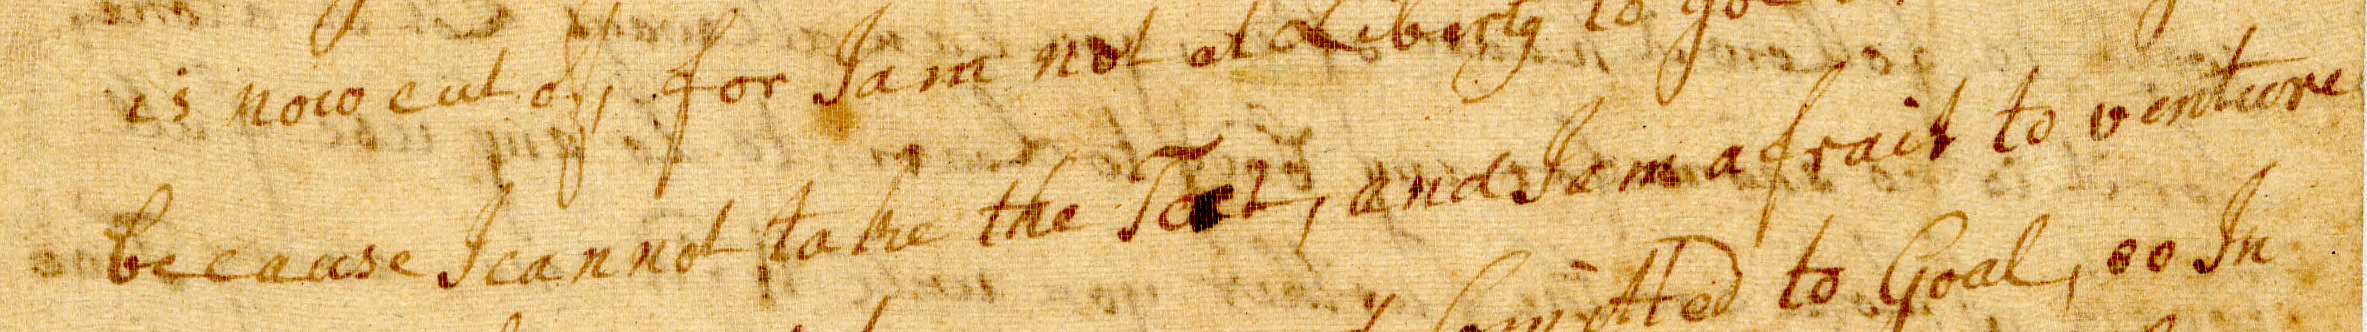because I cannot take the Tact, and I am afraid to venture
